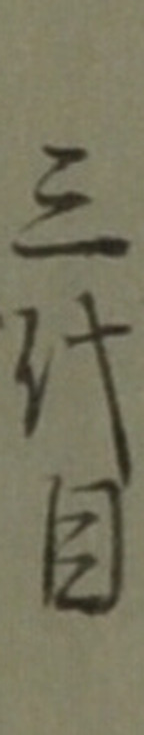三代目
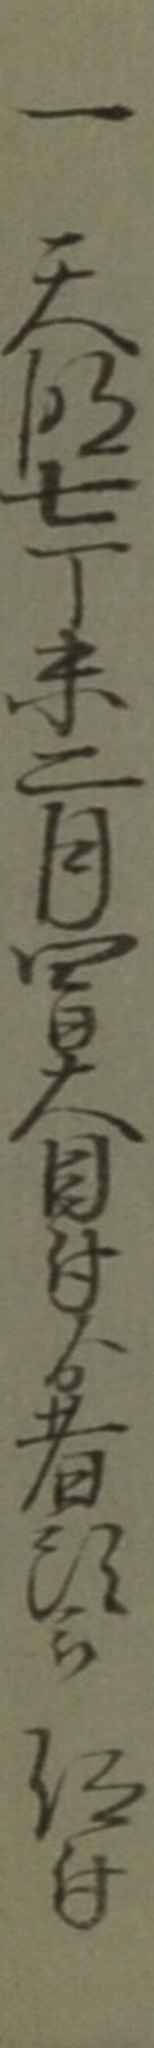一天明七丁未二月四日大目付ゟ者頭被仰付
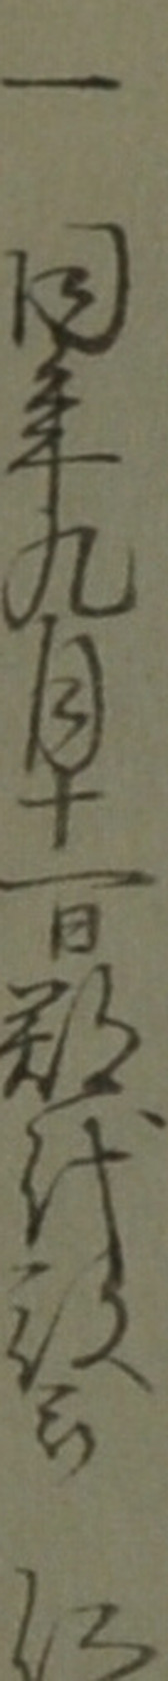一同年九月十一日郡代役被仰付
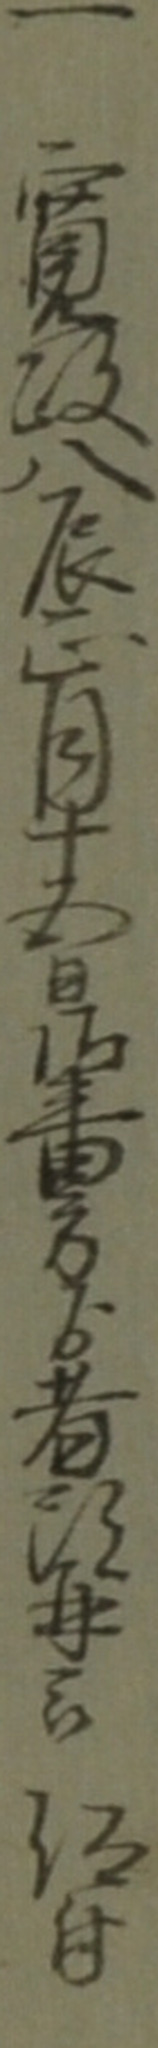一寛政八辰正月十五日御番方ゟ者頭再被仰付
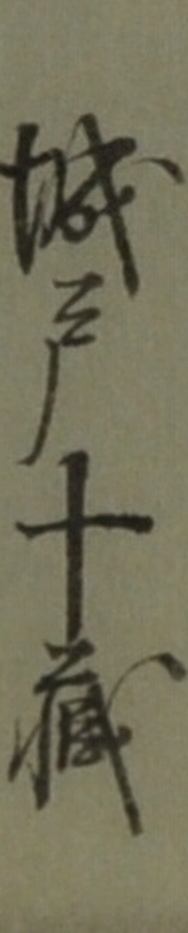城戸十蔵
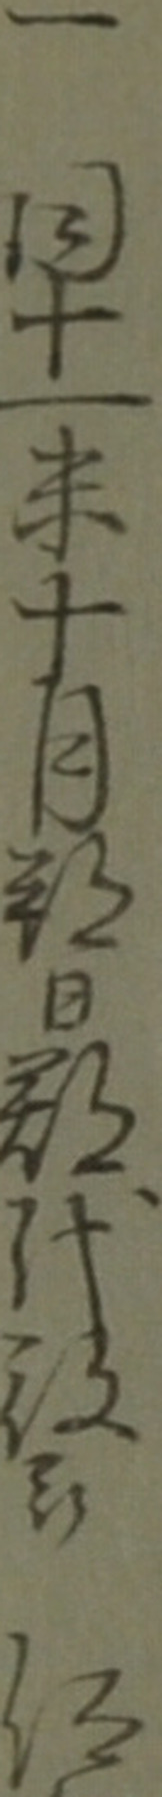一同十一未十月朔日郡代役被仰付
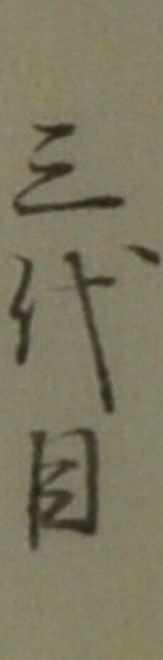三代目
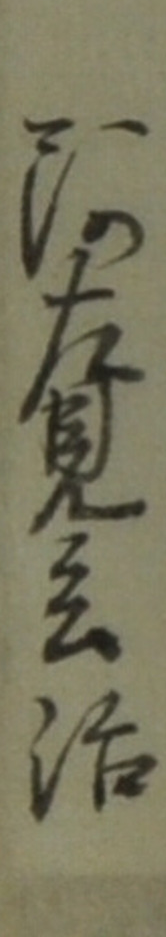阿左見兵治

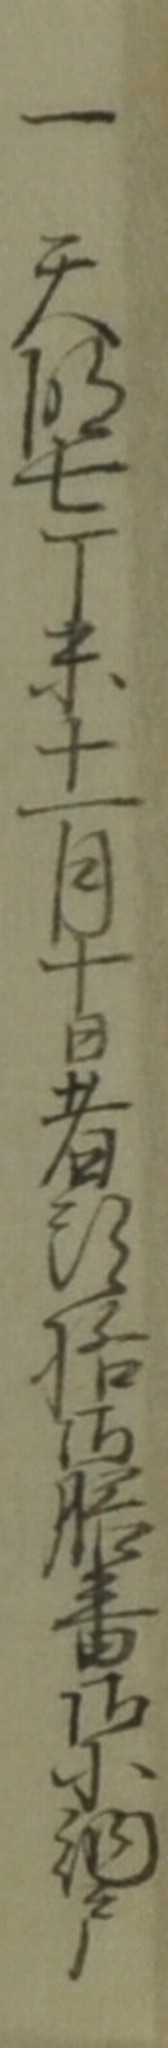一天明七丁未十一月十日者頭格御膳番御小納戸
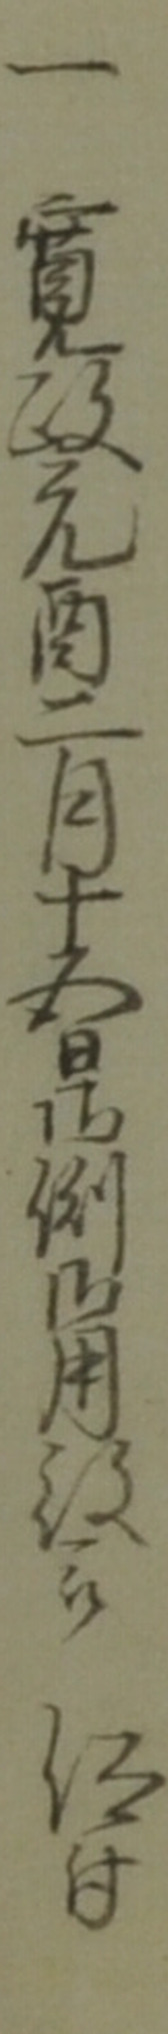一寛政元酉二月十五日御側御用役被仰付
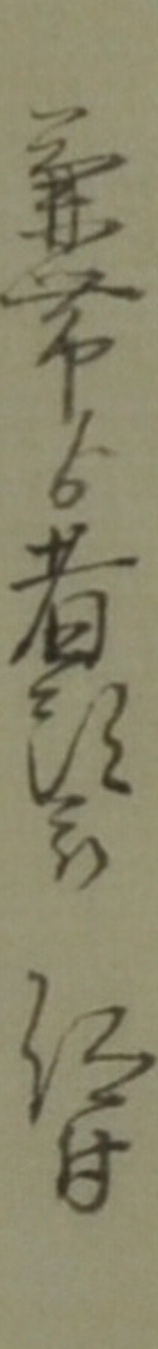兼帯ゟ者頭被仰付
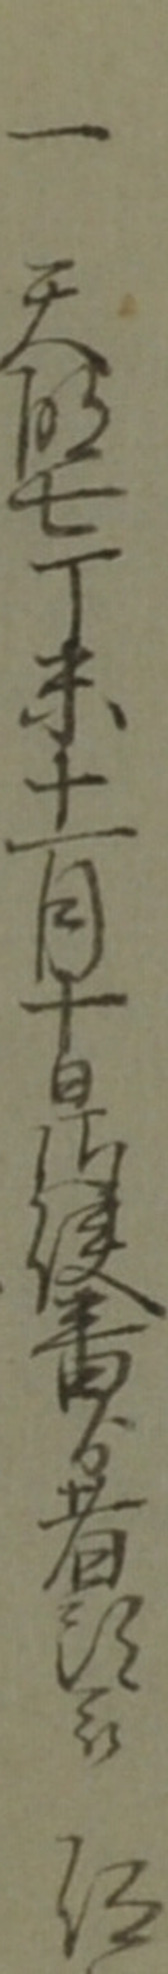一天明七丁未十一月十日御使番ゟ者頭被仰付
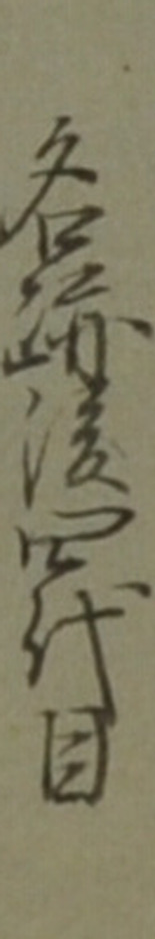名跡後四代目
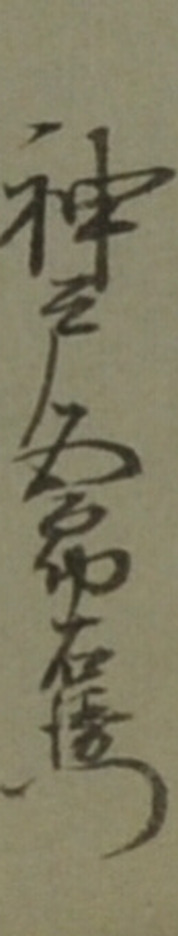神戸五郎右衛門
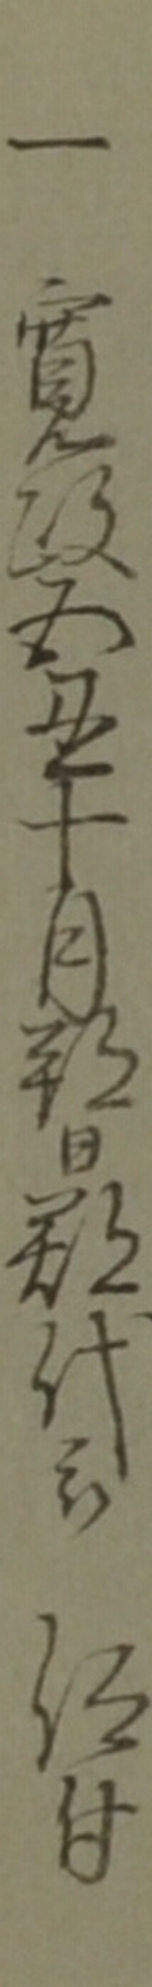一寛政五丑十月朔日郡代被仰付
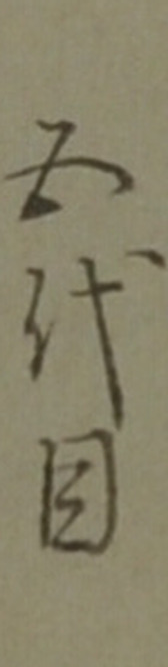五代目
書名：諸御役代々録（二）
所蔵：伊那市立高遠町図書館・合同会社AMANE
